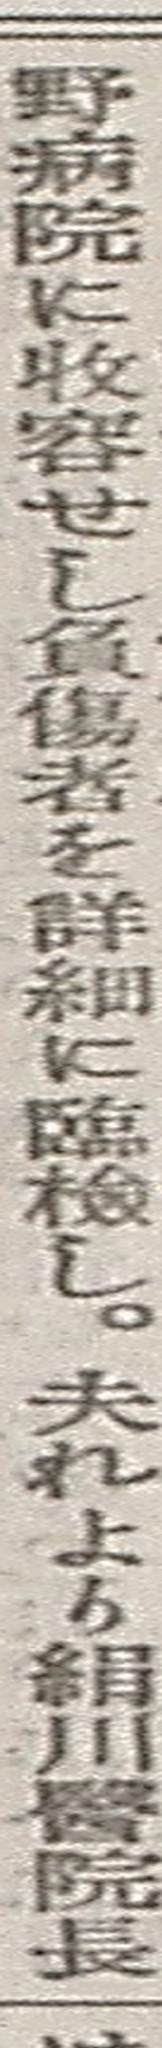野病院に収容せし負傷者を詳細に臨検し。夫れより絹川医院長
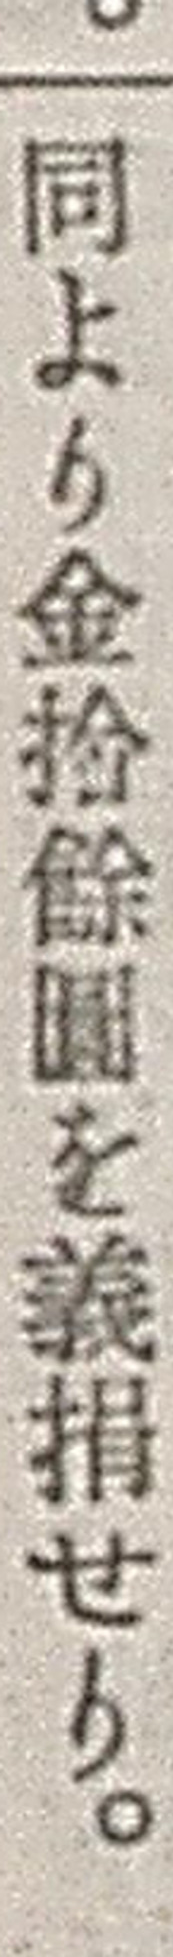同より金拾余円を義捐せり。
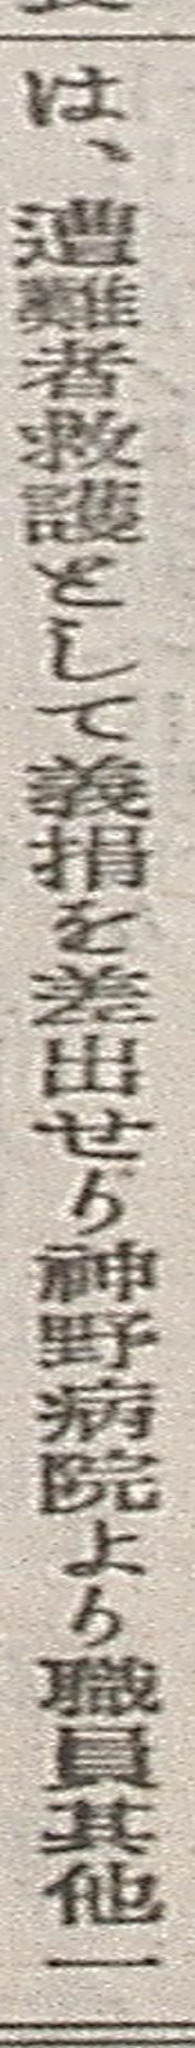は、遭難者救護として義捐を差出せり神野病院より職員其他一
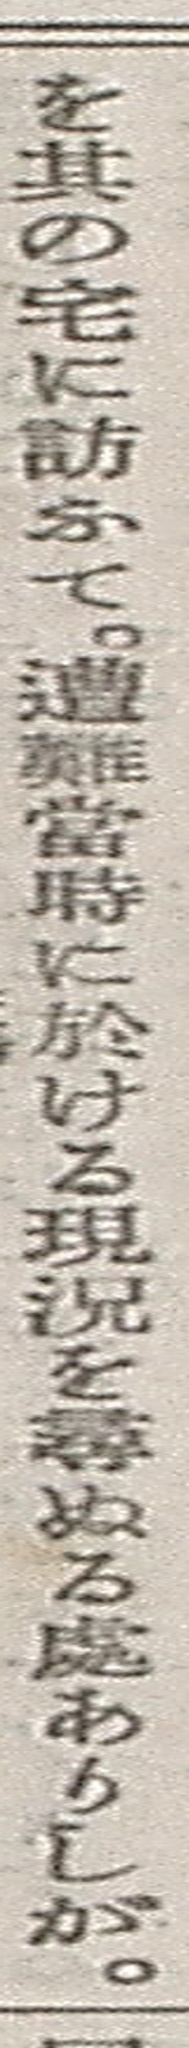を其の宅に訪ふて。遭難当時に於ける現況を尋ぬる処ありしが。
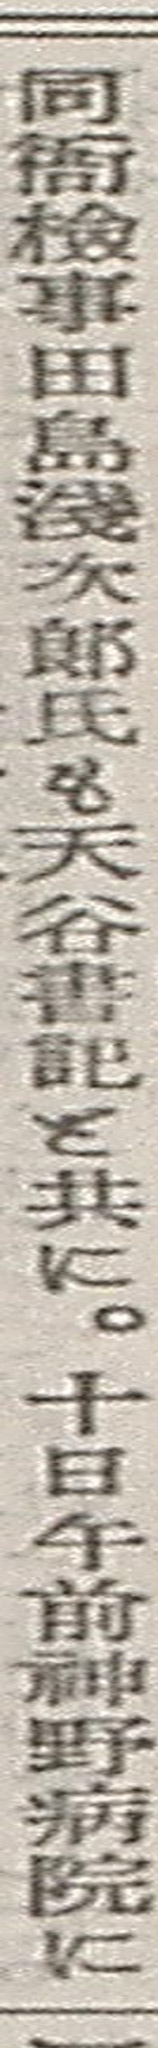同衙検事田島浅次郎氏も天谷書記と共に。十日午前神野病院に
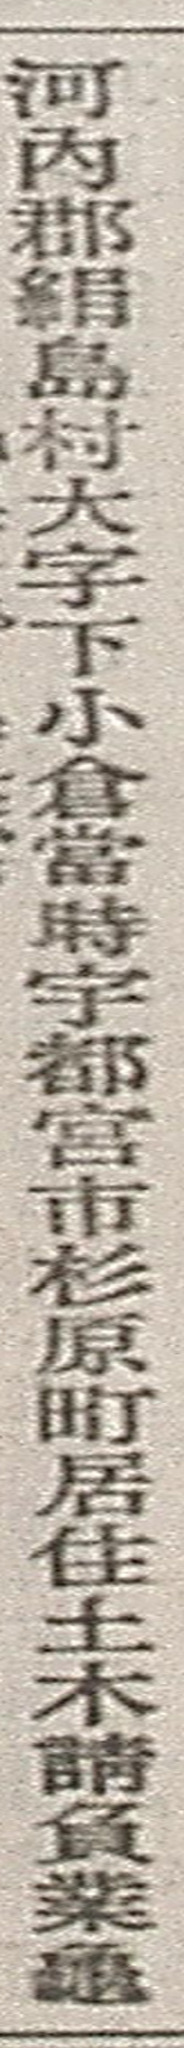河内郡絹島村大字下小倉当時宇都宮市杉原町居住土木請負業亀
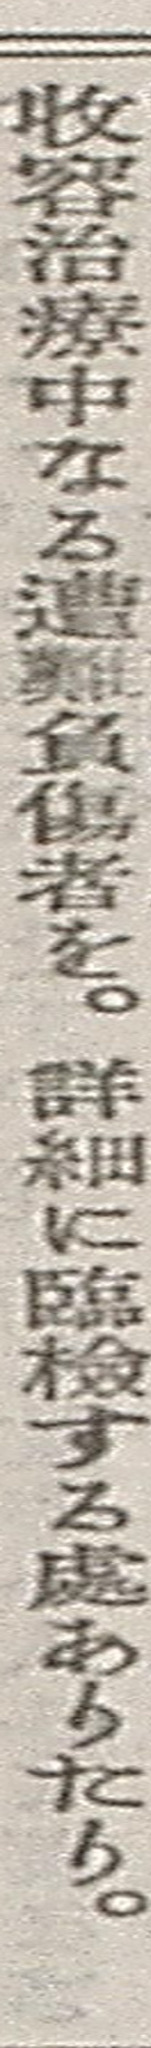収容治療中なる遭難負傷者を。詳細に臨検する処ありたり。
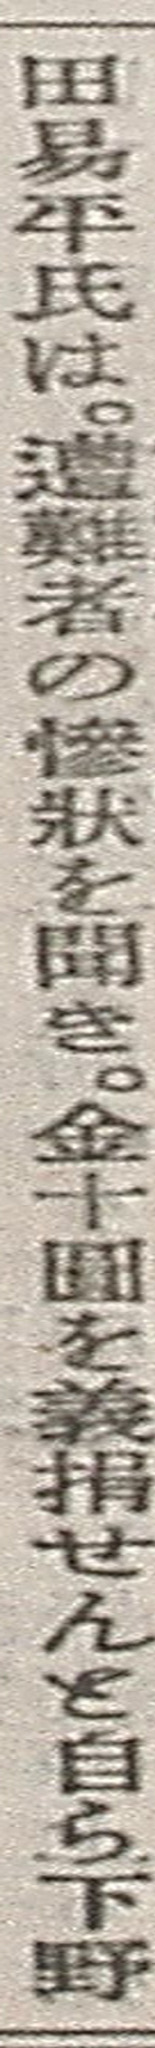田易平氏は。遭難者の惨状を聞き。金十円を義捐せんと自ら下野
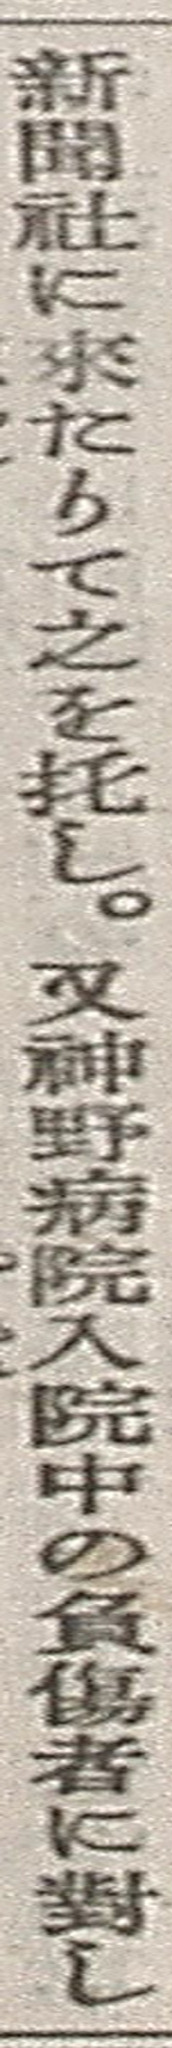新聞社に来たりて之を托し。又神野病院入院中の負傷者に対し
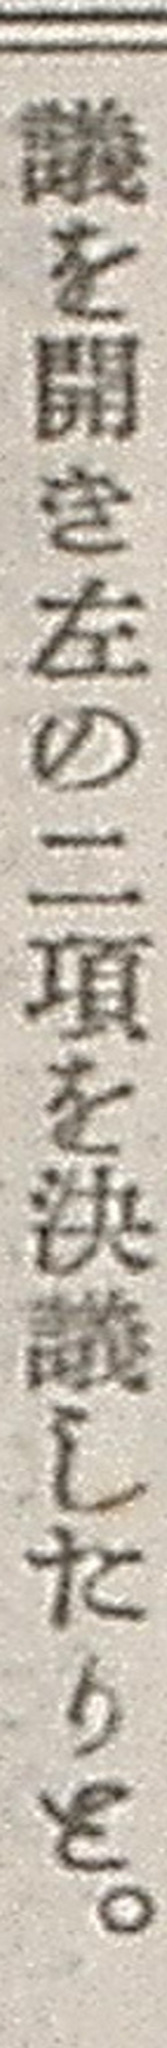議を開き左の二項を決議したりと。
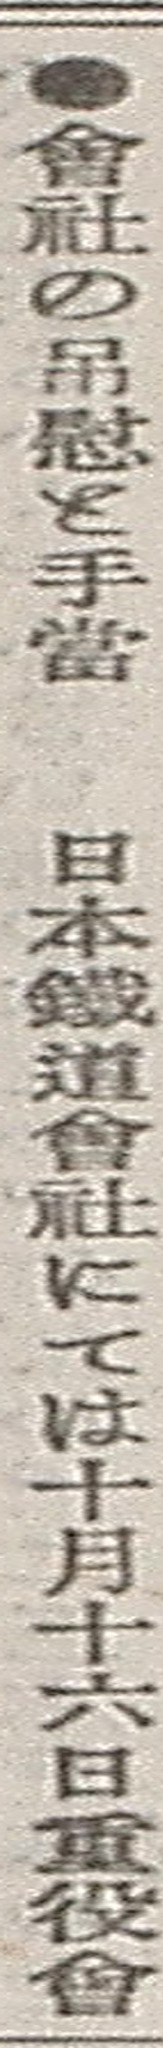●会社の吊慰と手当日本鉄道会社にては十月十六日重役会
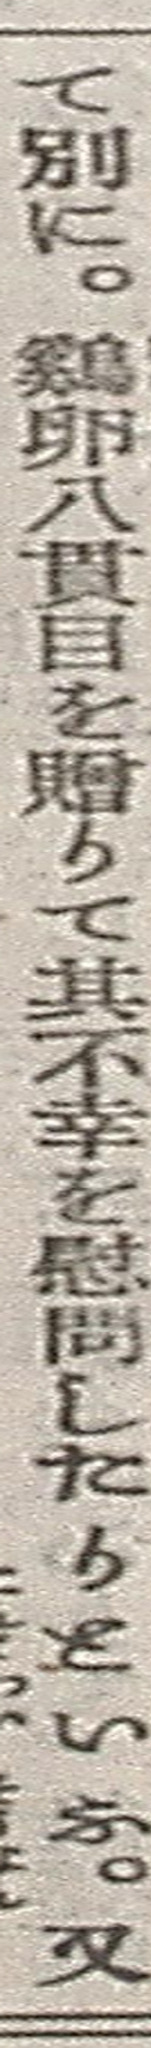て別に。鶏卵八貫目を贈りて其不幸を慰問したりといふ。又
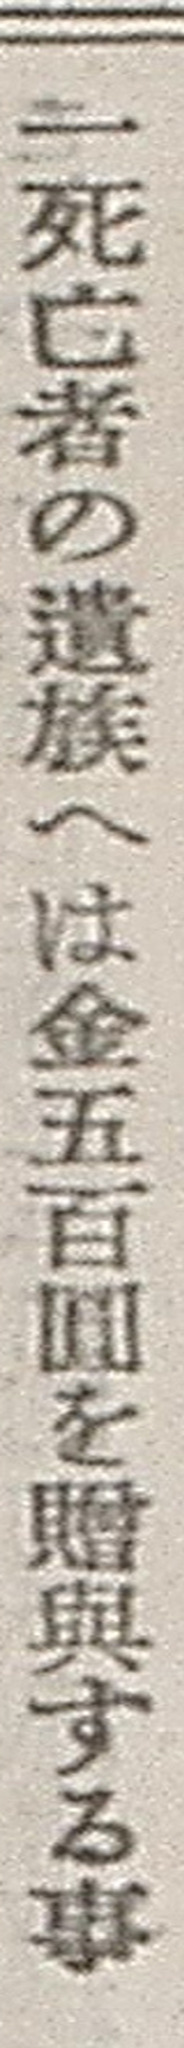一死亡者の遺族へは金五百円を贈与する事
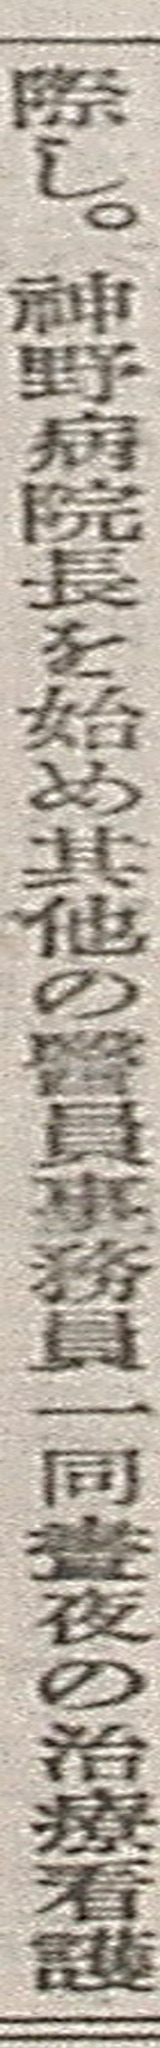際し。神野病院長を始め其他の医員事務員一同昼夜の治療看護
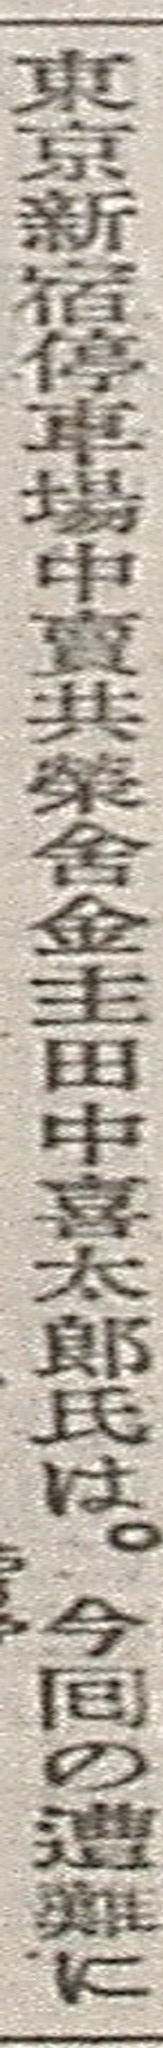東京新宿停車場中売共栄舎金主田中喜太郎氏は。今回の遭難に
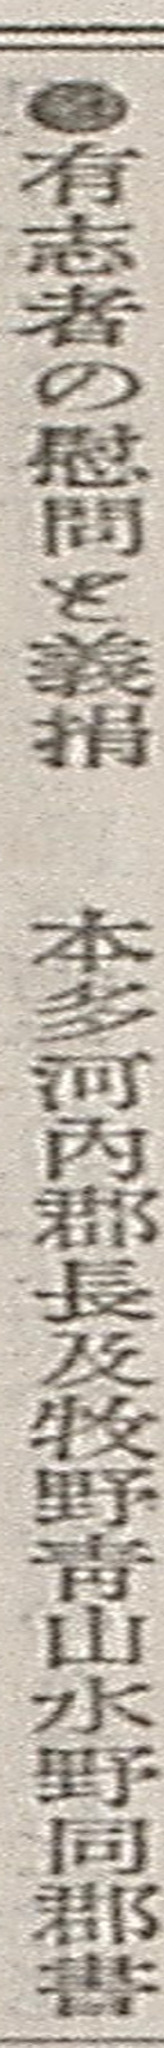●有志者の慰問と義捐本多河内郡長及牧野青山水野同郡書
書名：風俗畫報臨時増刊第百九十九號　明治三十二年十月各地災害圖會（前編之續）
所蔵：東京大学地震研究所図書室 Earthquake Research Institute Library, The University of Tokyo, JAPAN
